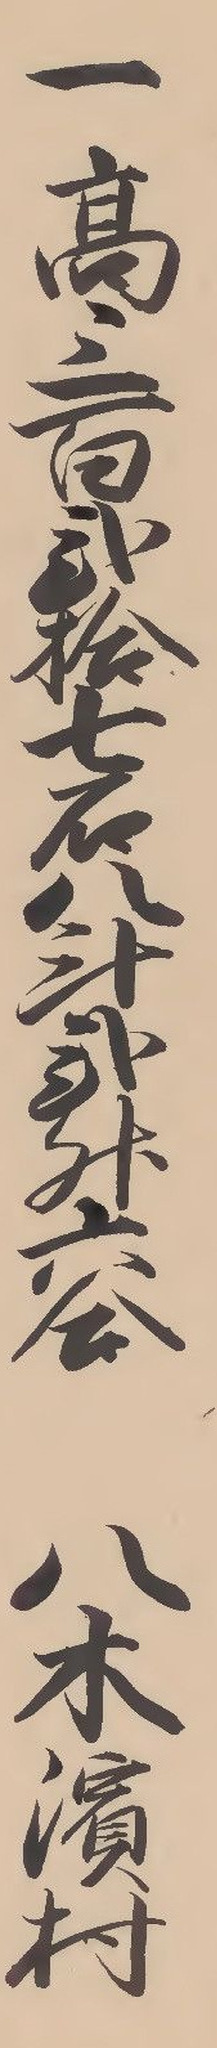一高三百弐拾七石八斗弐升六合八木浜村
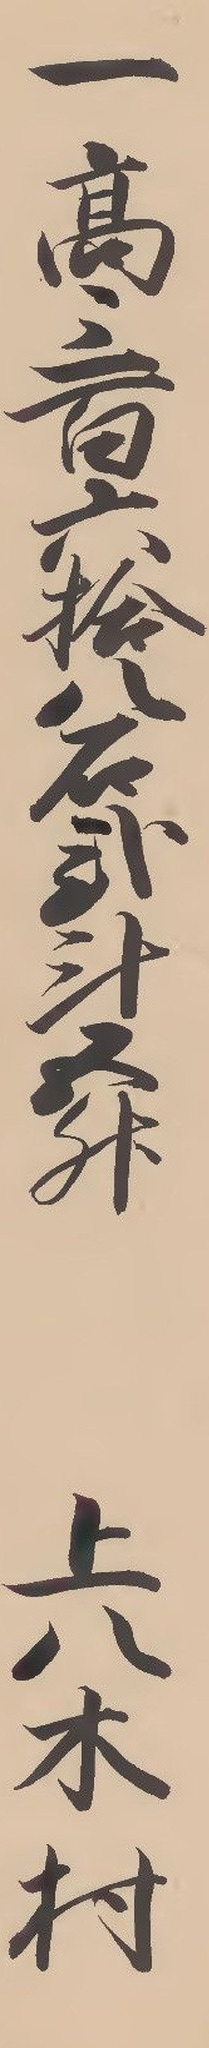一高三百六捨八石弐斗五升上八木村
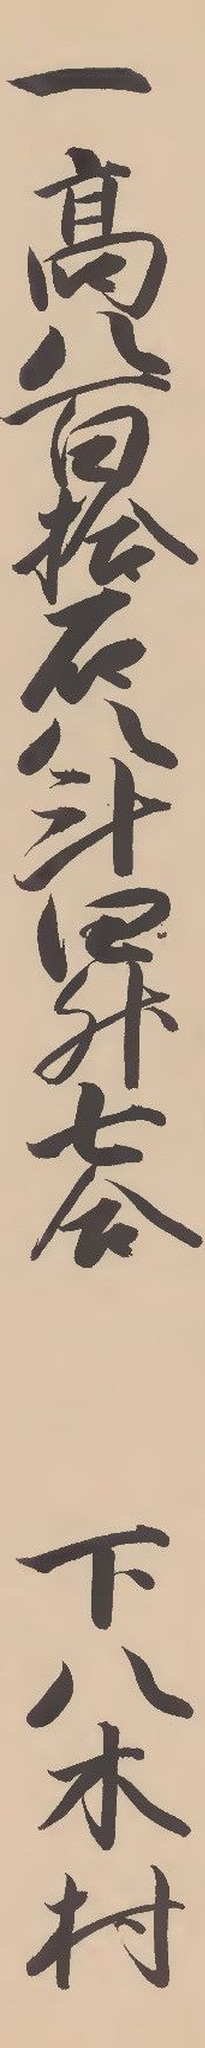一高八百拾石八斗四升七合下八木村
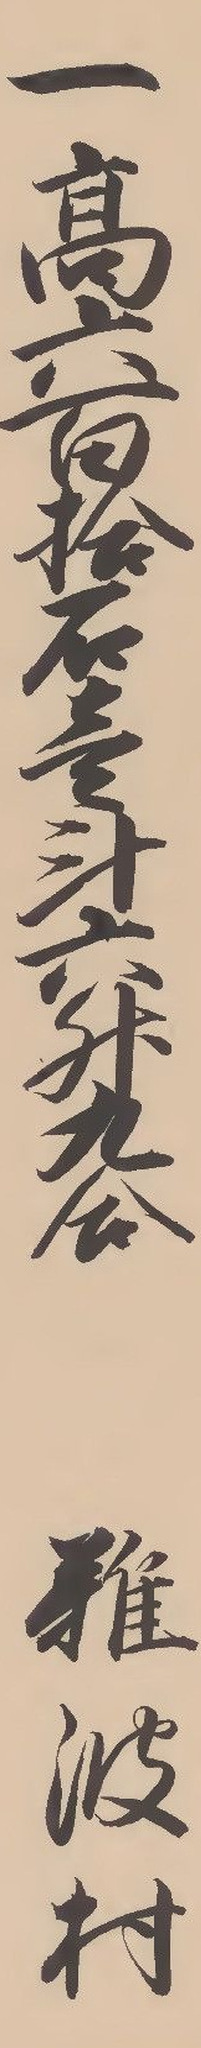一高六百拾石壱斗六升九合難波村
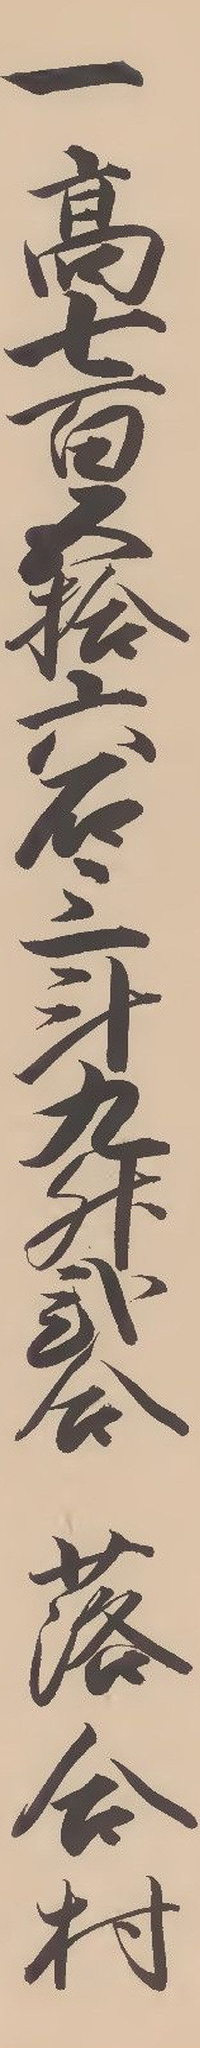一高七百五拾六石三斗九升弐合落合村
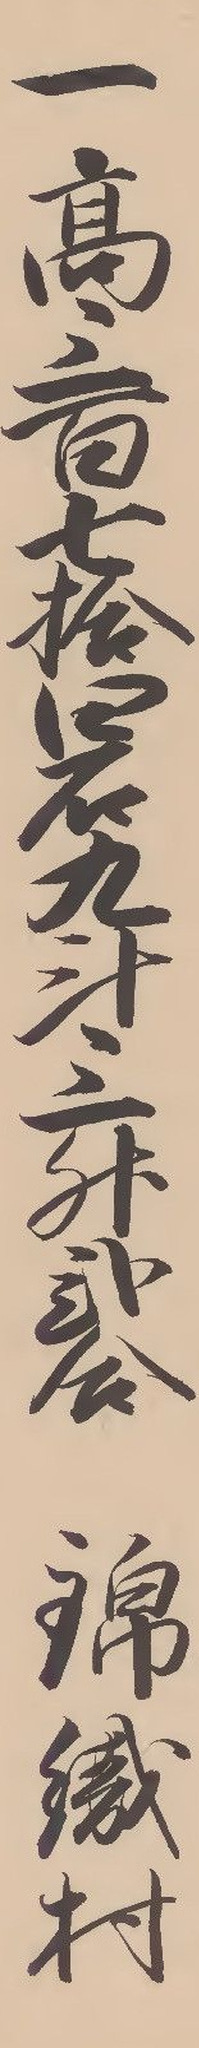一高三百七拾四石九斗三升弐合錦織村

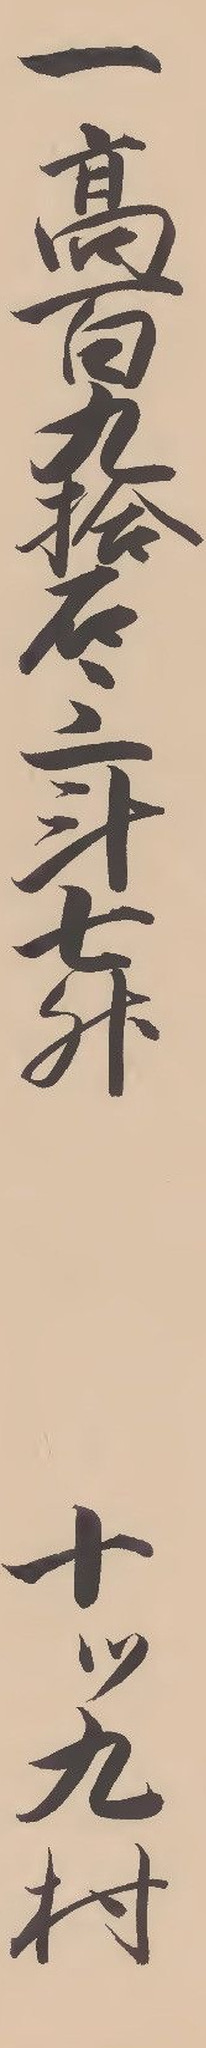一高百九拾石三斗七升十ツ九村
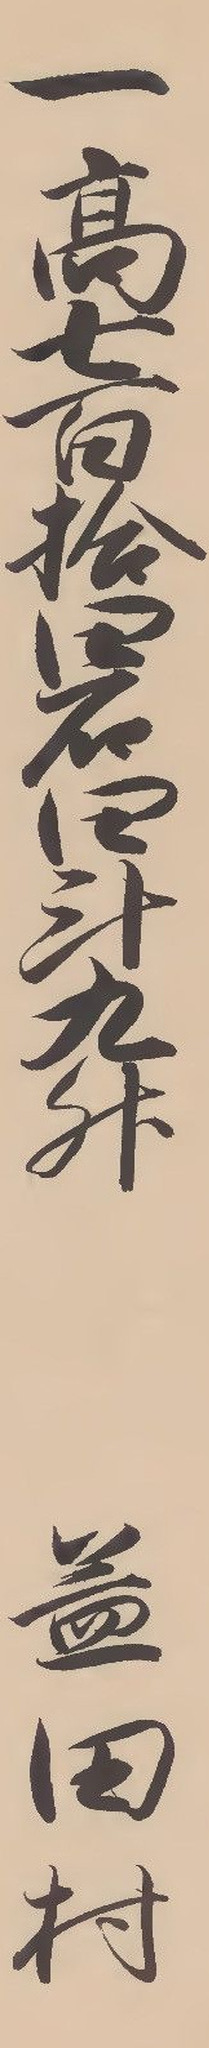一高七百拾四石四斗九升益田村
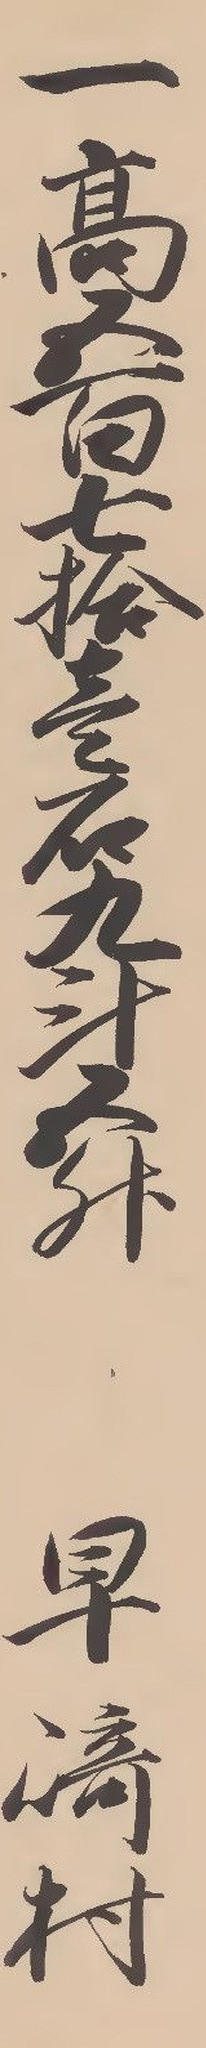一高五百七拾壱石九斗五升早崎村
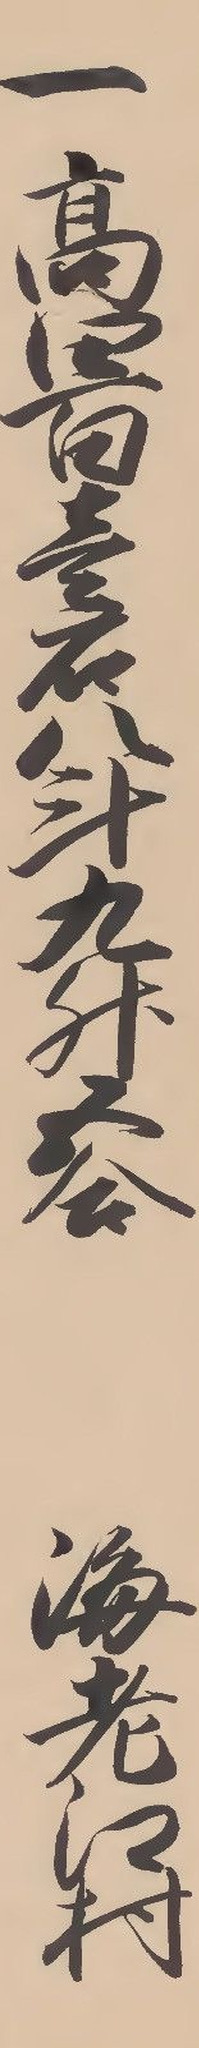一高四百壱石八斗九升五合海老江村
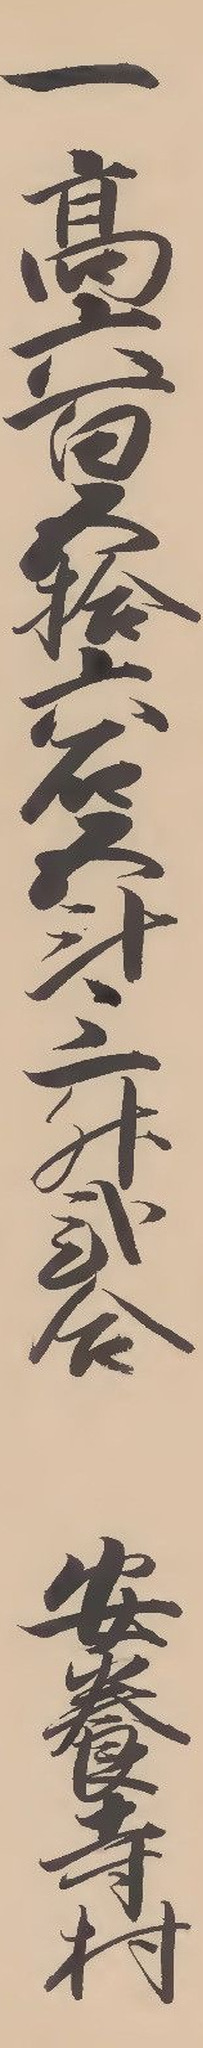一高六百五拾六石五斗三升弐合安養寺村
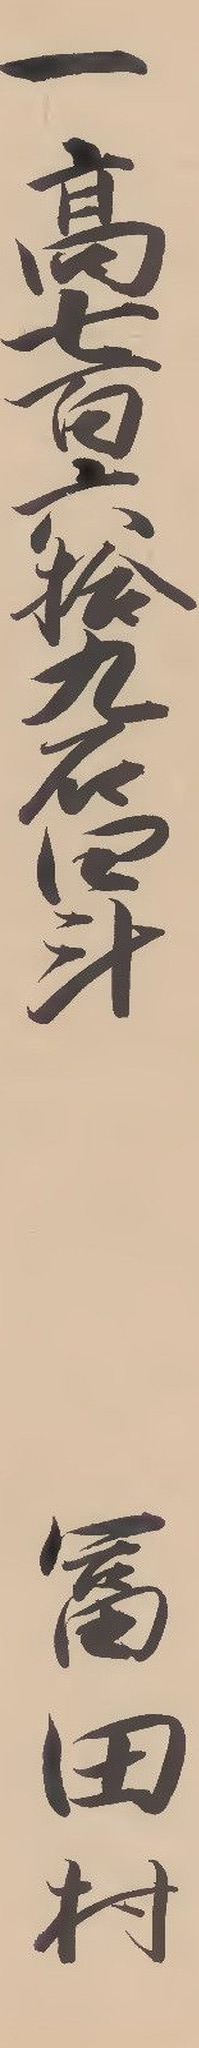一高七百六拾九石四斗富田村
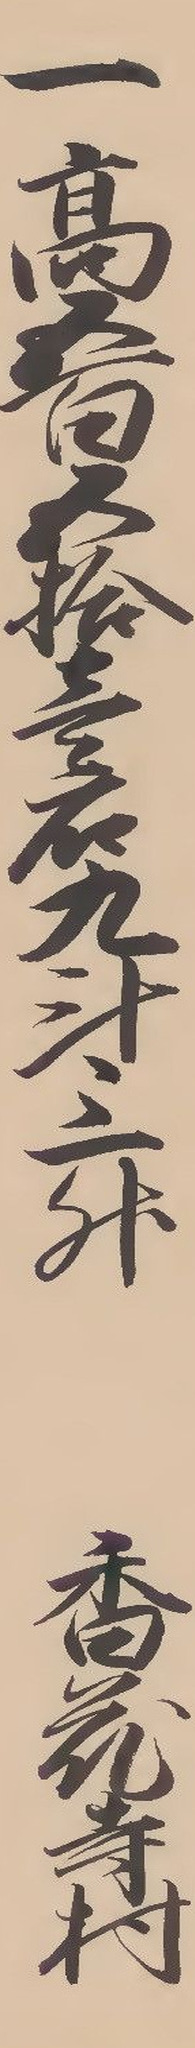一高五百五拾壱石九斗三升香花寺村

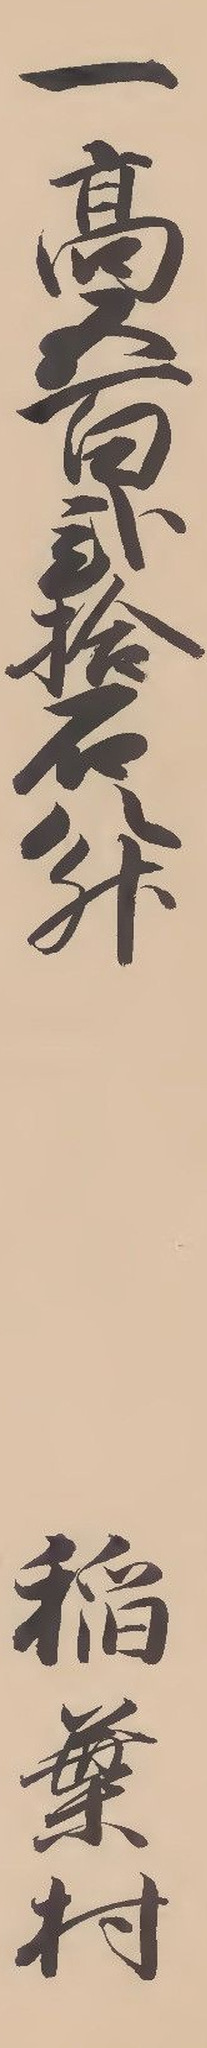一高五百弐拾石八升稲葉村
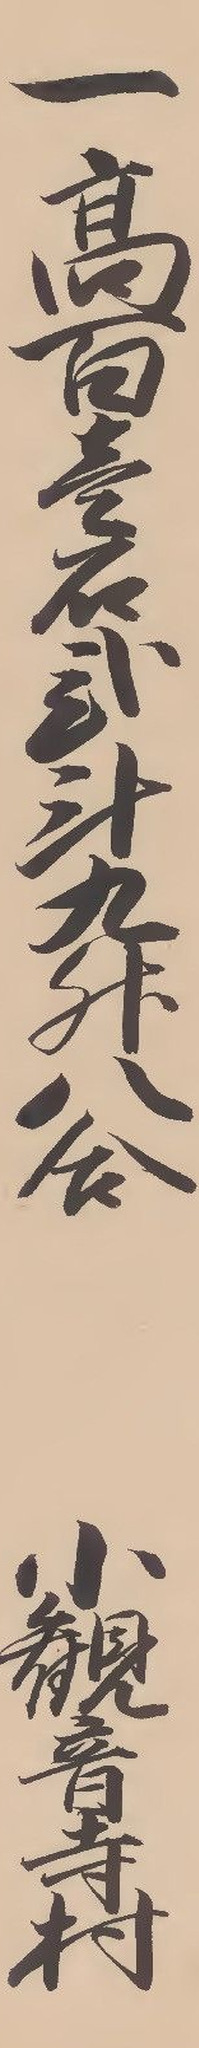一高百壱石弐斗九升八合小観音寺村
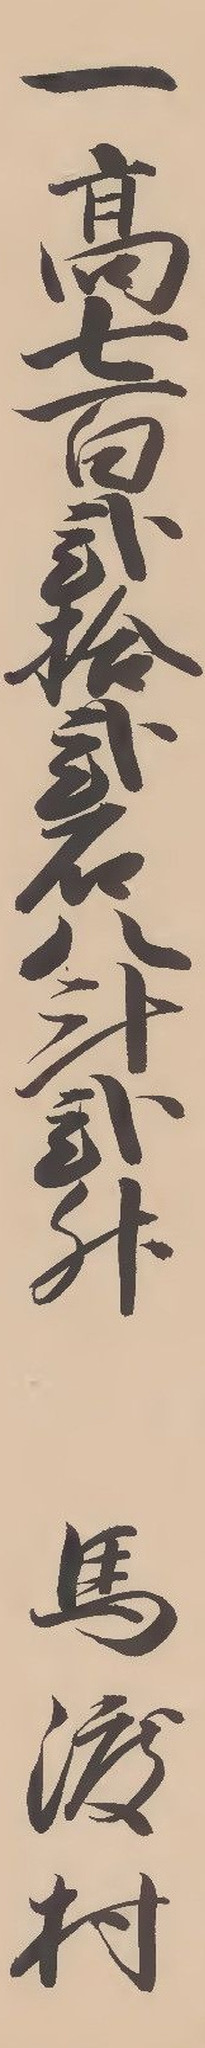一高七百弐拾弐石八斗弐升馬渡村
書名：近江国郷帳
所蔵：国立公文書館 National Archives of Japan
